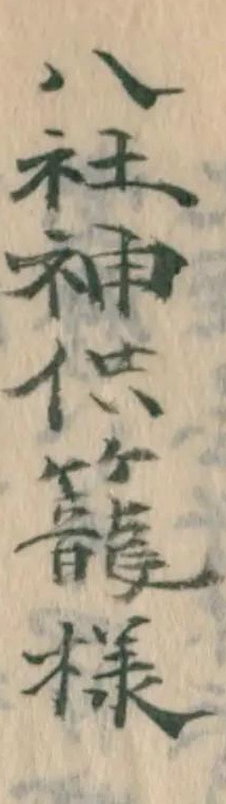八社神供籠様

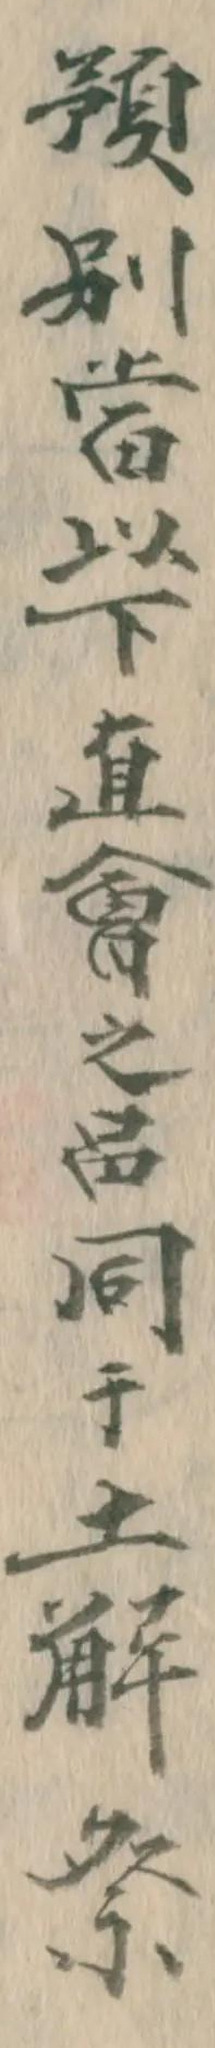預別当以下直会之品同于土解祭
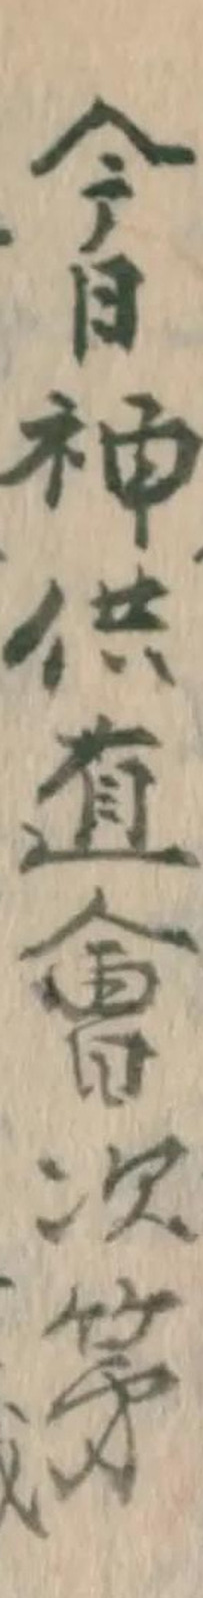今日神供直会次第
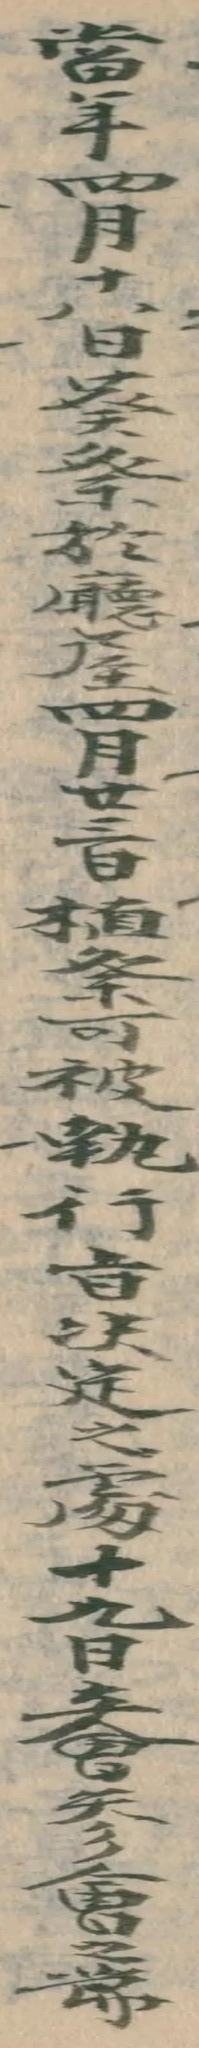当年四月十八日葵祭於庁屋四月廿三日植祭可被執行旨決定之処十九日立会参会之節廿二日復被定
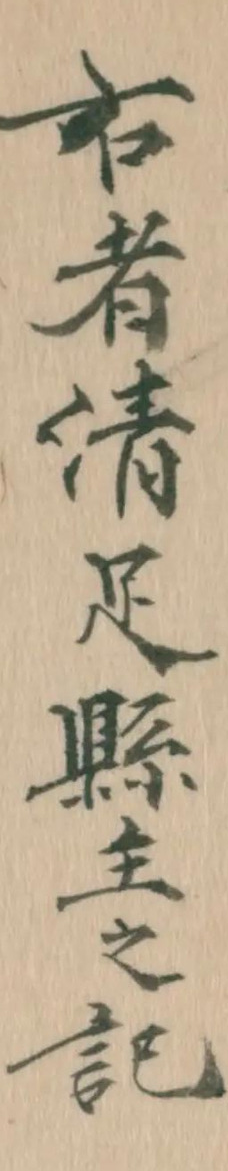右者清足県主之記
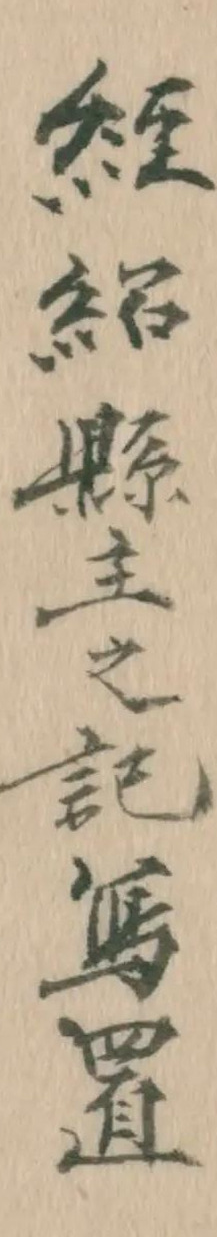経紹県主之記写置
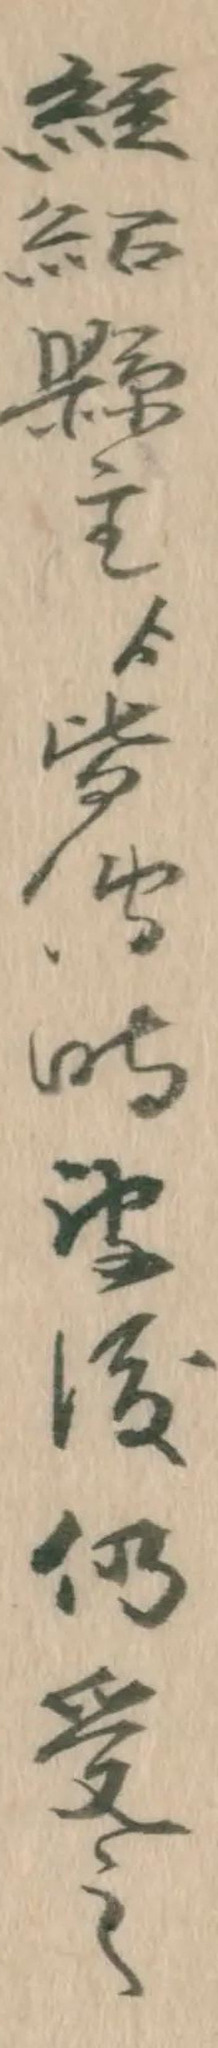経詔県主ゟ皆伝時彼渡仍受之
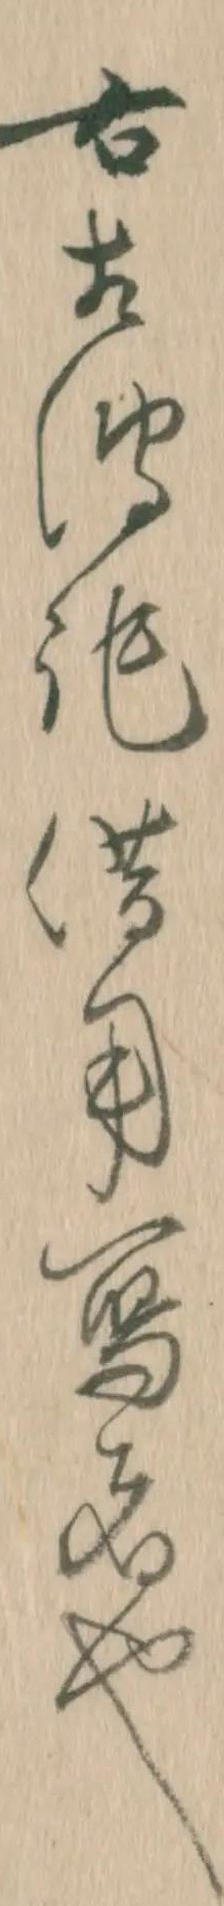右相伝記借用写者也
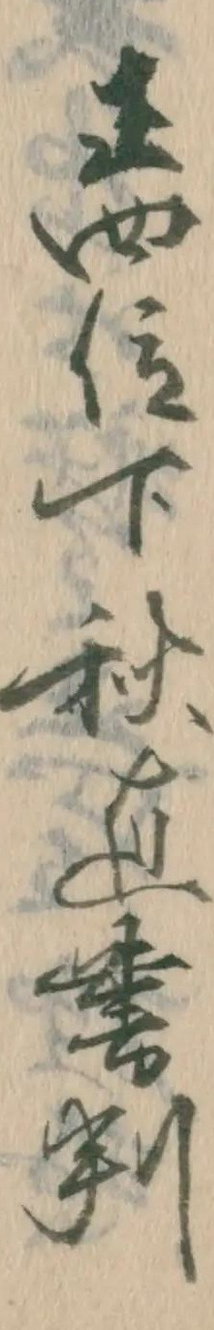正四位下秋直書判

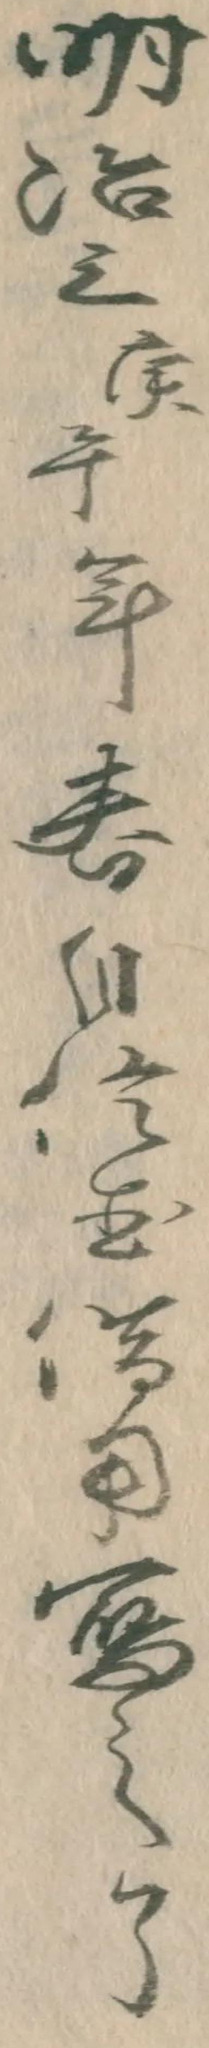明治三庚午年春自侭置借用写之了

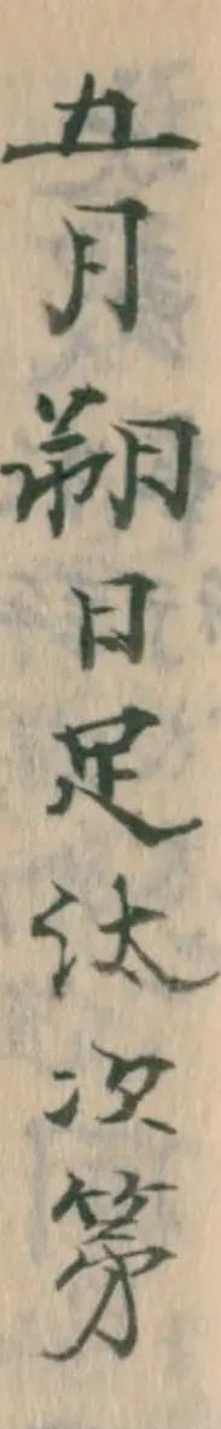五月朔日足汰次第

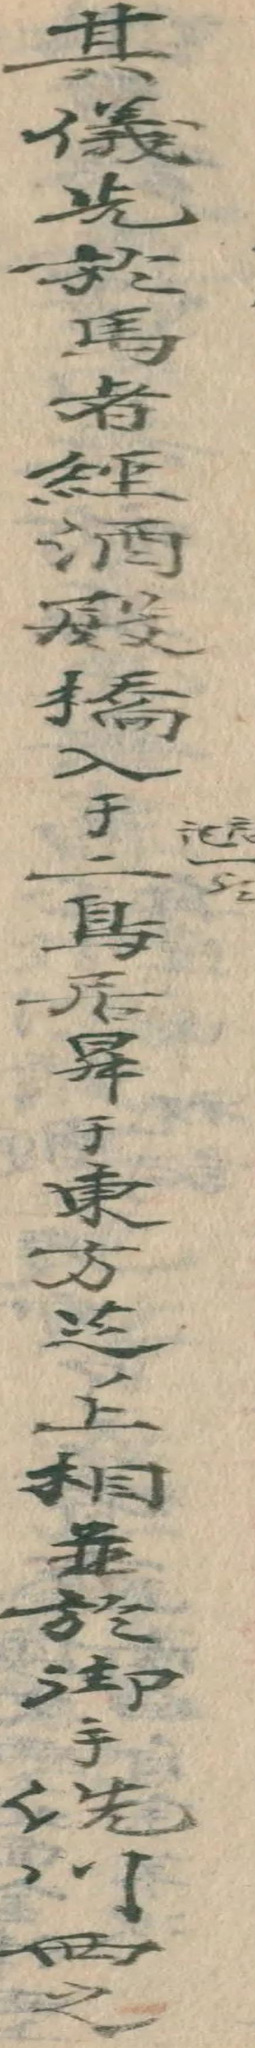其儀先於馬者経酒殿橋入于二鳥居昇于東方芝ノ上相並於御手洗川西之

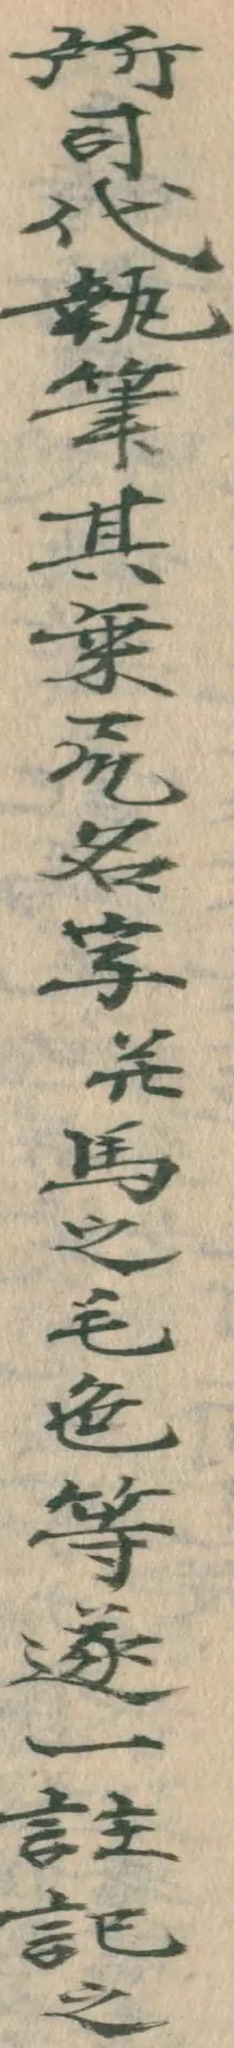所司代執筆其乗尻名字并馬之毛色等遂一註記之
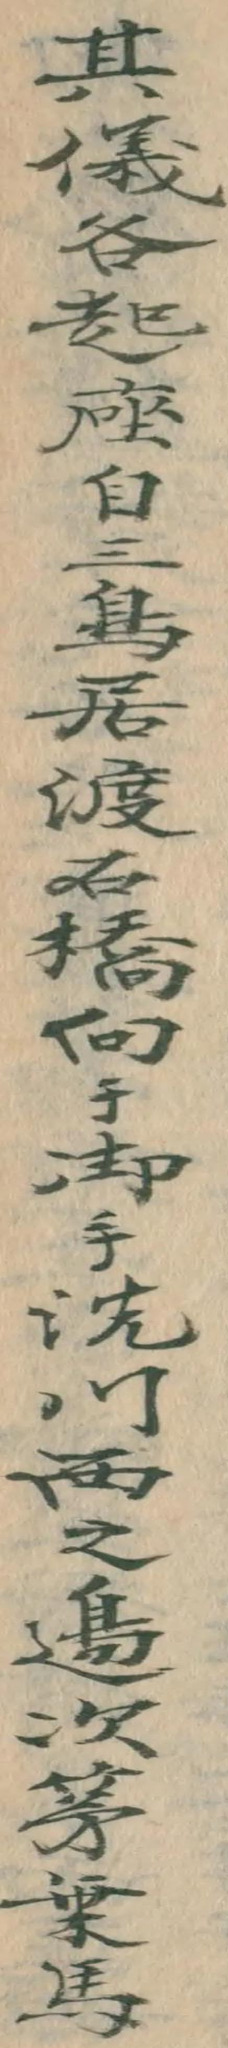其儀各起座自三鳥居渡石橋向于御手洗川西之辺次第乗馬

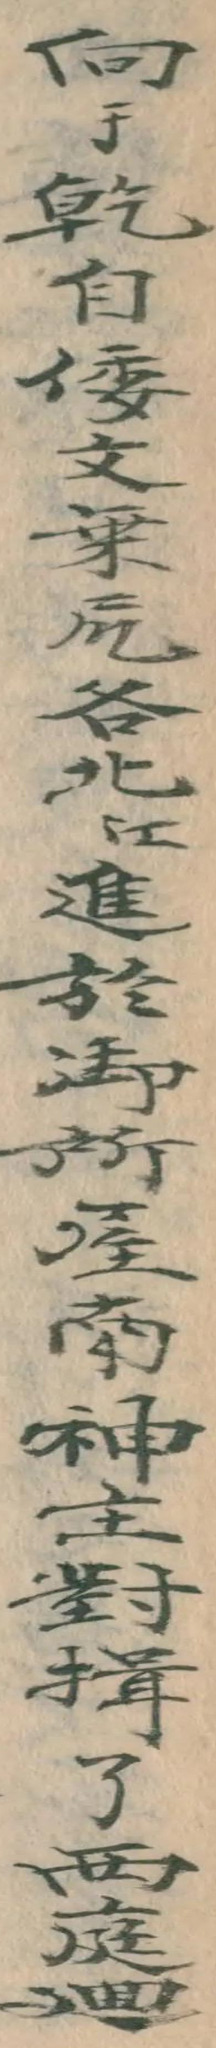向于乾自倭文乗尻各北江進於御所屋南神主対揖了西庭廻
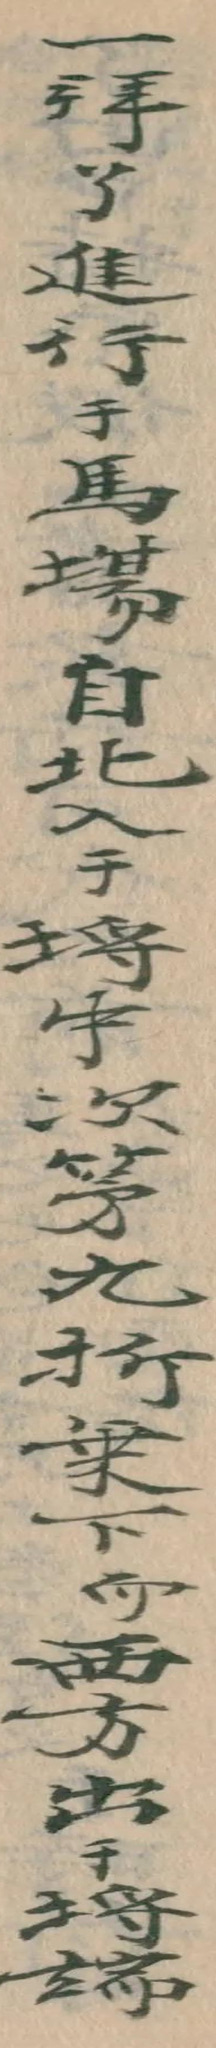一拝了進行于馬場自北入于埒中次第九折乗下而西方出于埒端
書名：賀茂社記録. 第9冊
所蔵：国立国会図書館 National Diet Library, JAPAN
